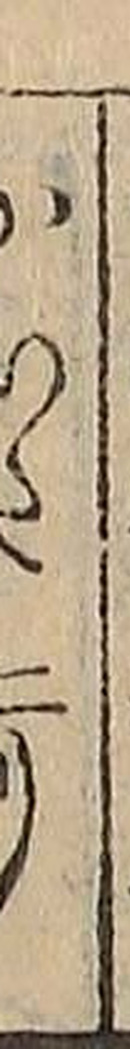かいた二リ
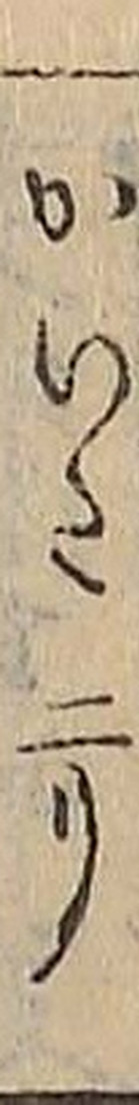かいた二リ
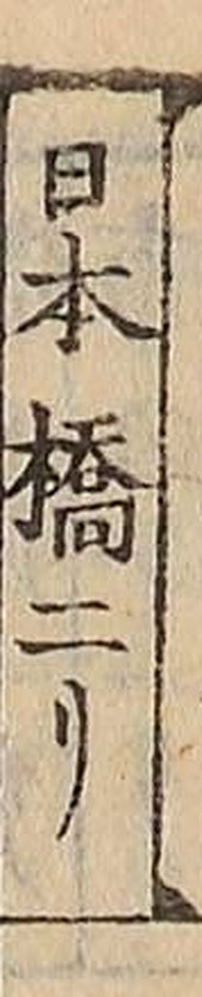日本橋二リ
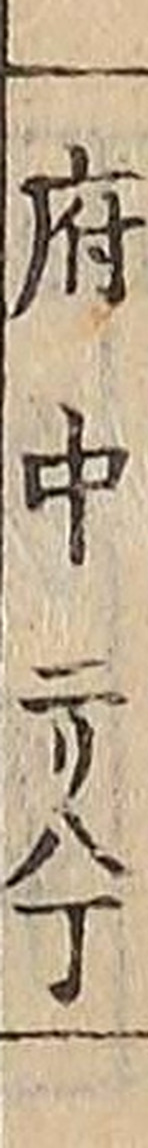府中二リ八丁
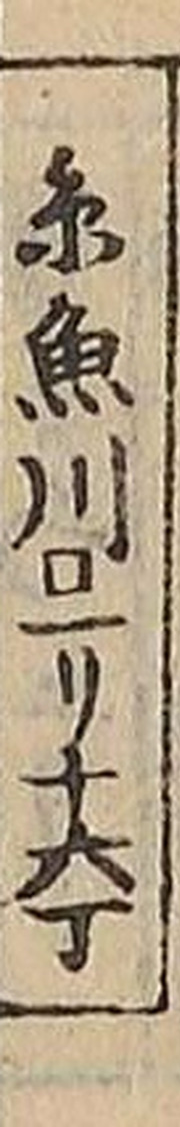糸魚川▫一リ十六丁
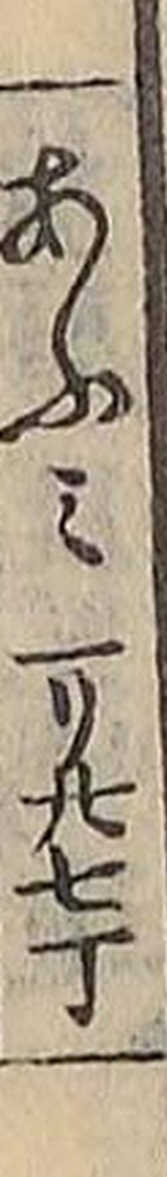あふみ一リ廿七丁
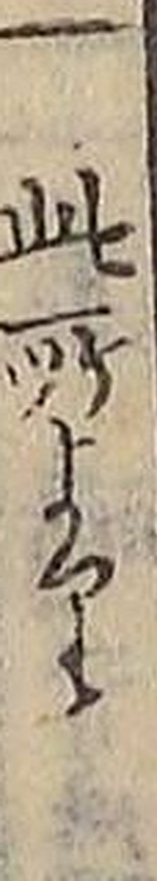此所より
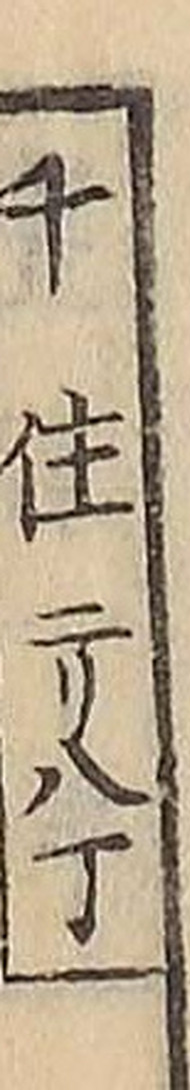千住二リ八丁
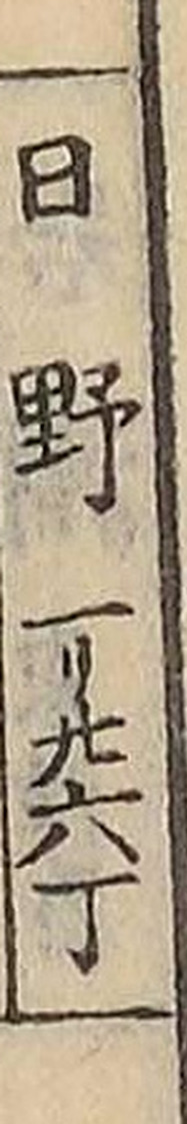日野一リ廿六丁
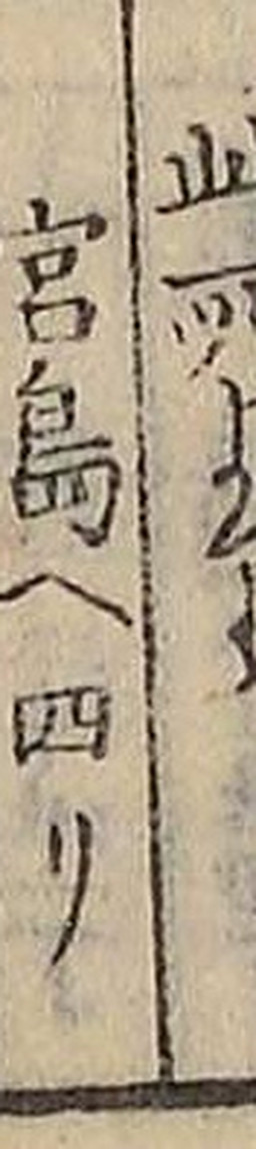宮島へ四リ
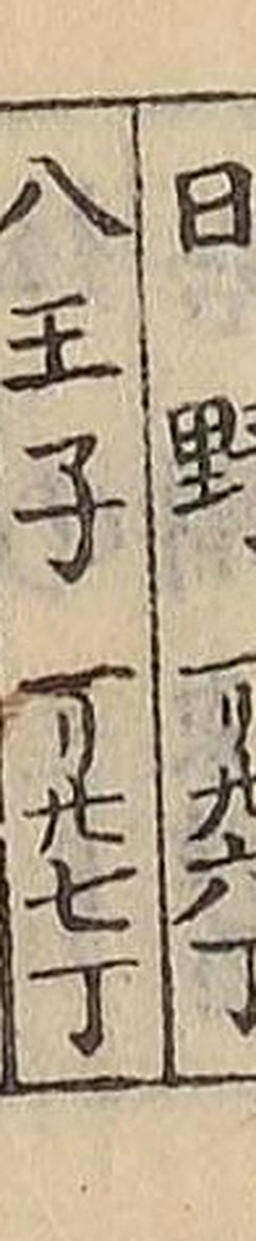八王子一リ廿七丁
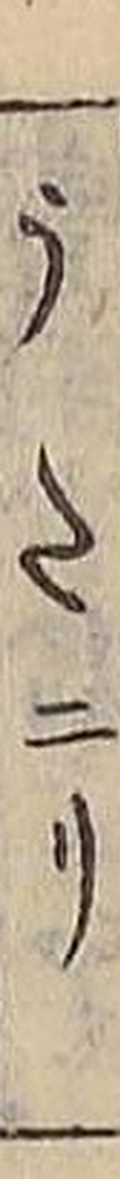うた二リ
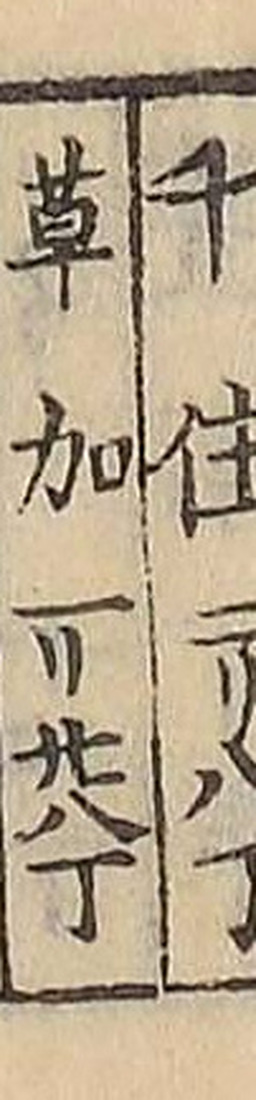草加一リ廿八丁
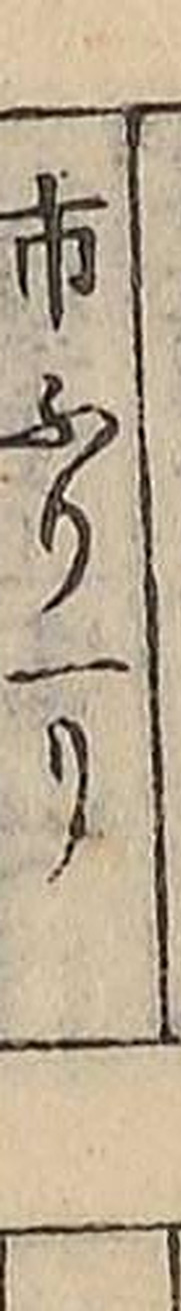市ふり一リ
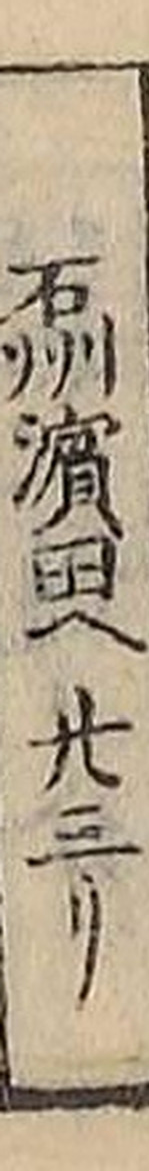石州浜田へ廿三リ
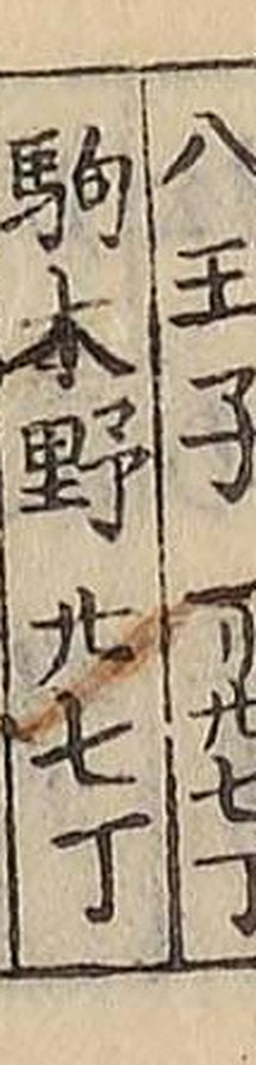駒木野廿七丁
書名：旅行用心集
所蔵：神戸大学附属図書館 国文学研究資料館
